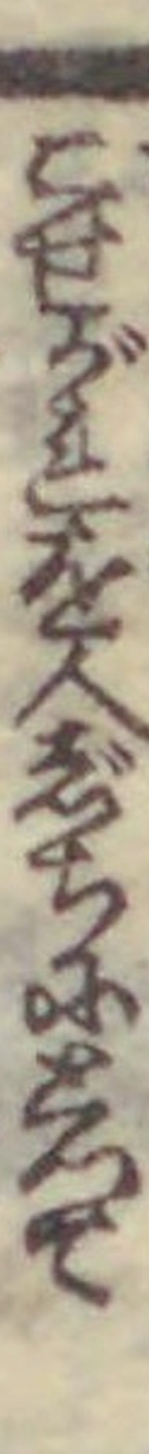こせがれを人じちにとつて
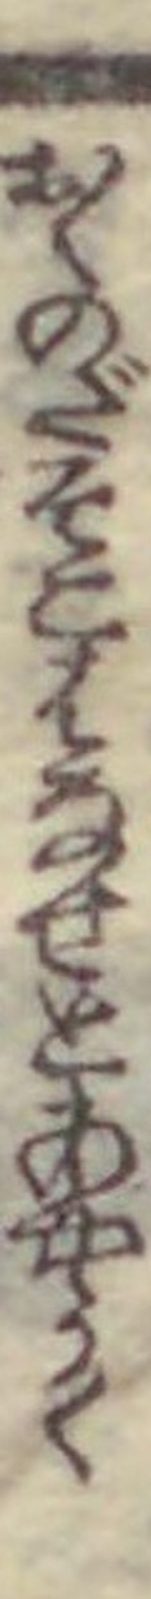おくのだそこはなせとあやうく
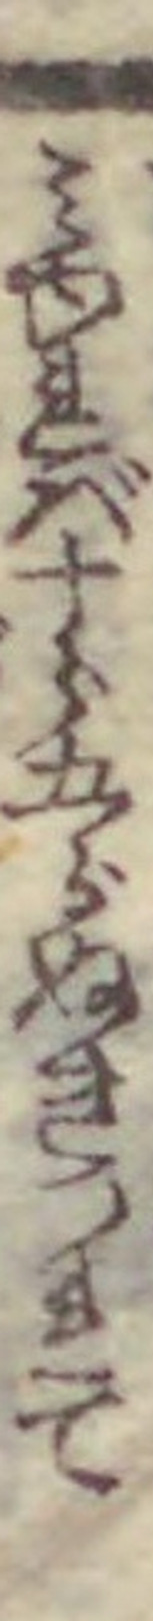みゆれば十郎五郎ぬきつれて
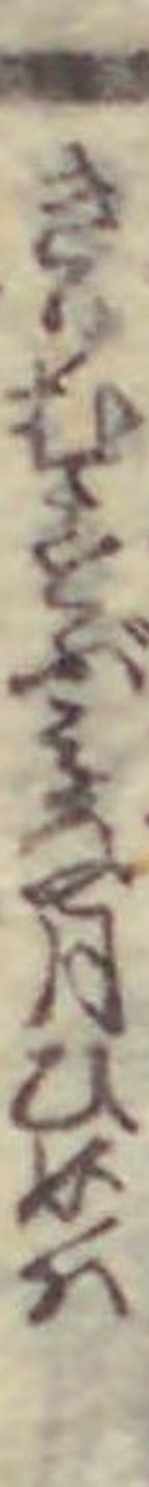きりむすぶみな月ひめは
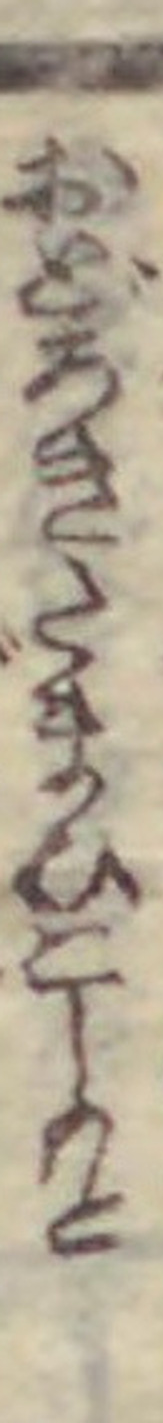おどろきたまひこしもと
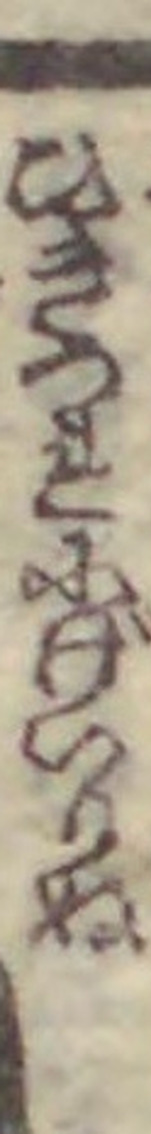ひきつれにげいりぬ
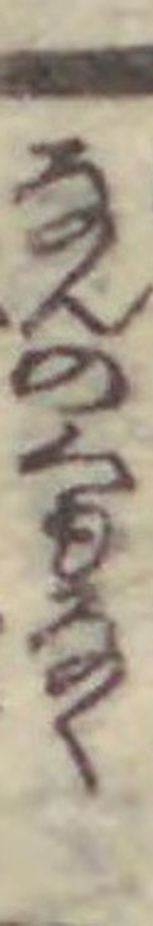なんのくもなく
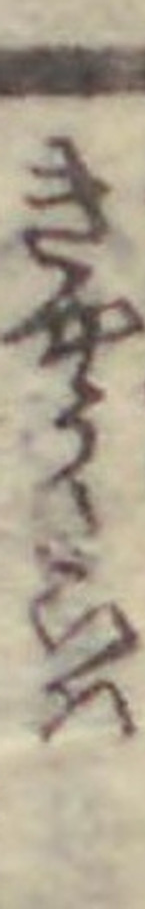きやうたいは
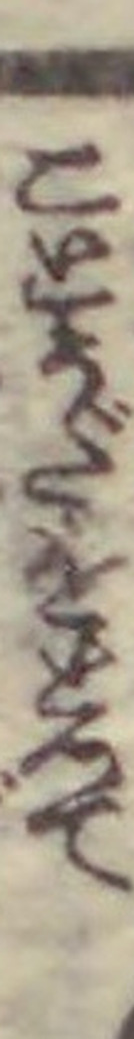ことうだをとつて
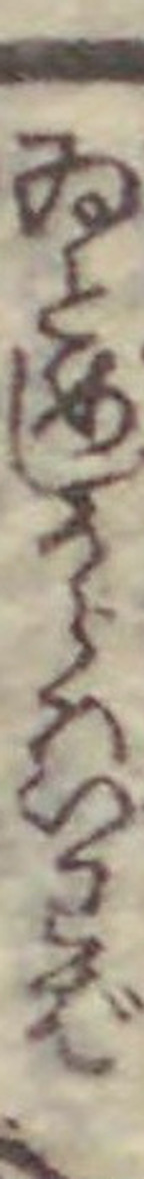ゐとめしからはいわば
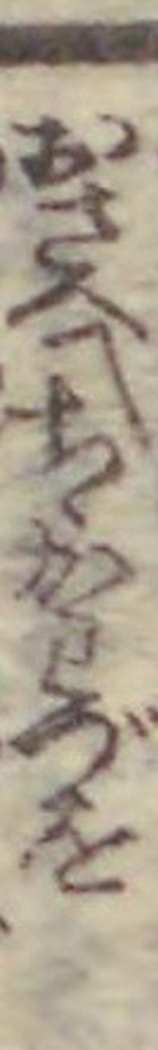おさへ〽ちゝかわづを
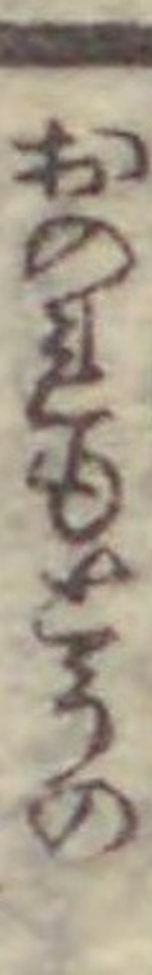おのれもとうの
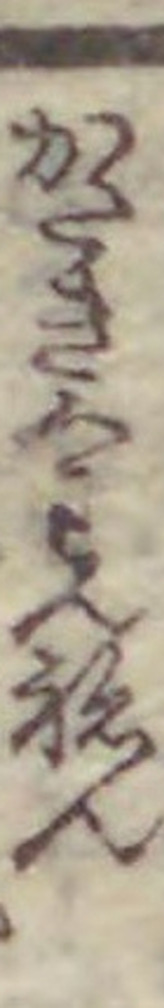かたきくわんねん
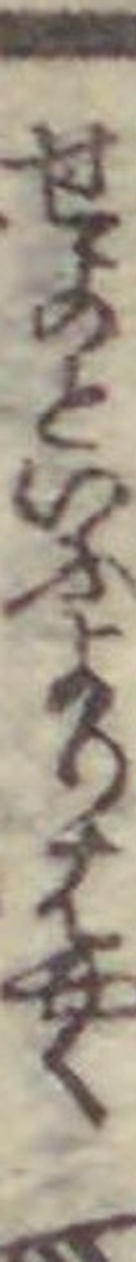せよといふよりはやく
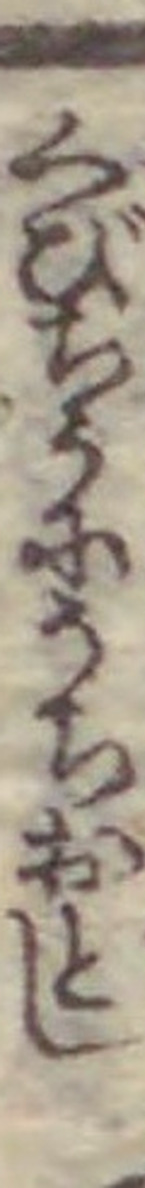くびちうにうちおとし
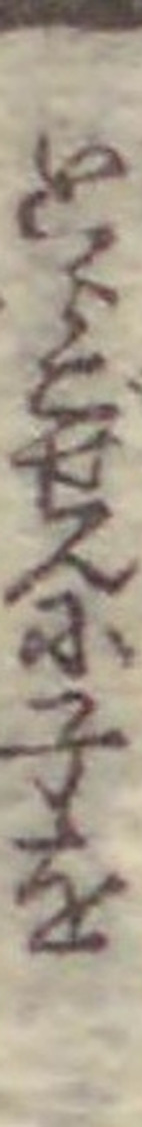とらごせんに子を
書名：大時代唐土化物 3巻. 曽我太夫染
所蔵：国立国会図書館 National Diet Library, JAPAN
